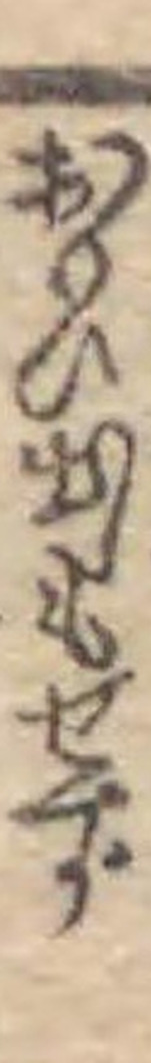おもひ出しもせず
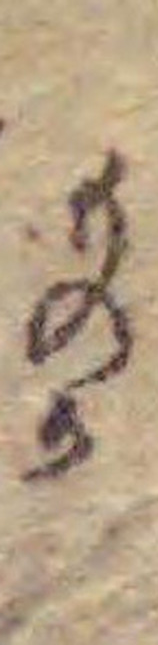ものか
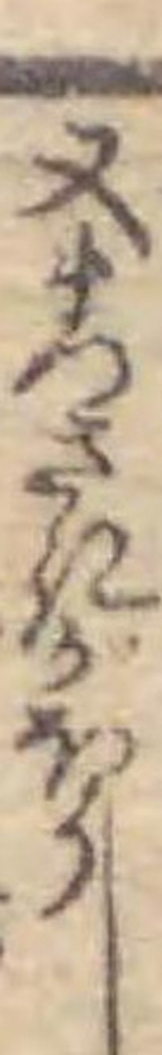又まつさきがほう
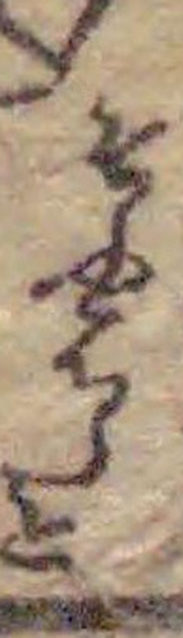そふはらを
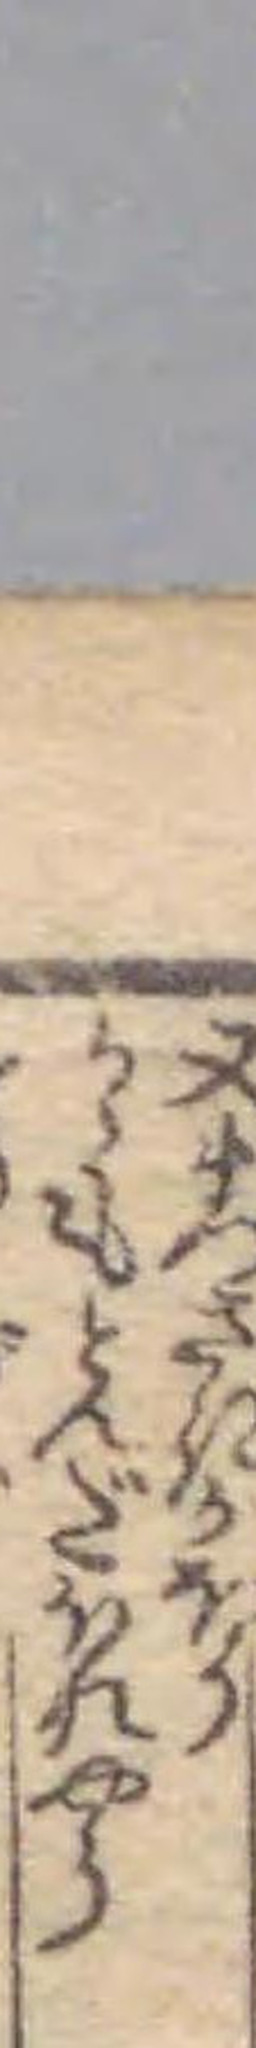からもとんだほれやう
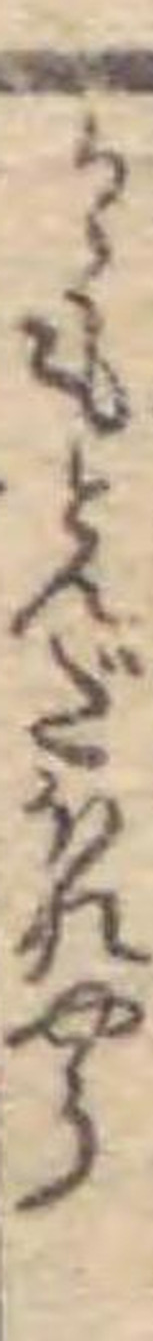からもとんだほれやう
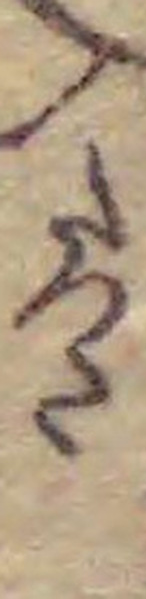たつた
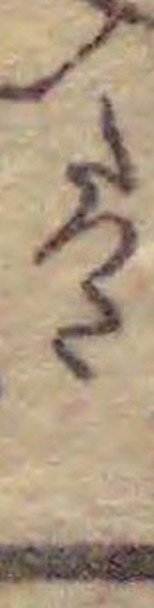たつた
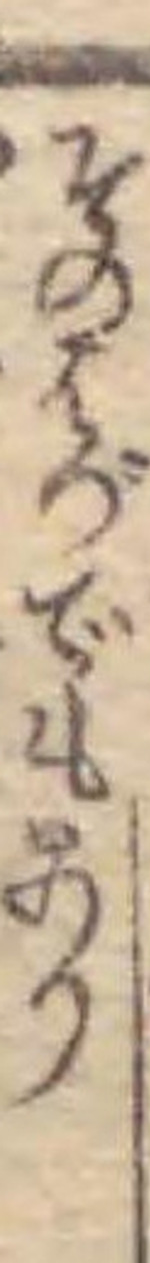そのはづでもあり
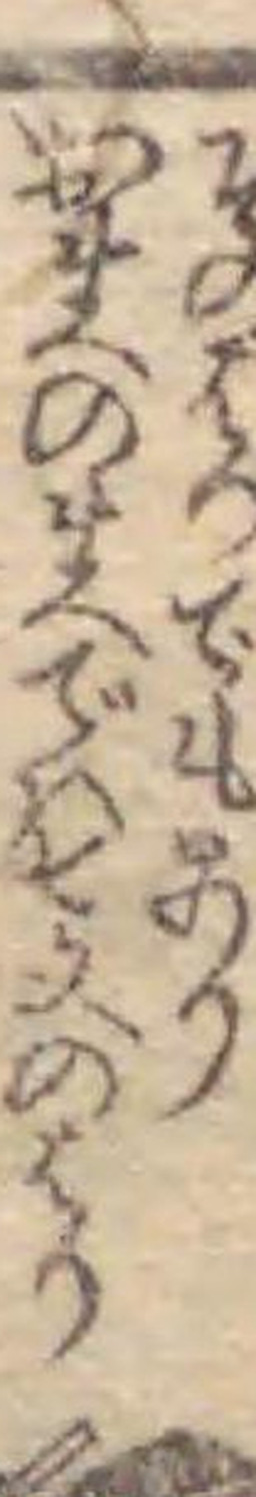おまへのまへでは七文のはり
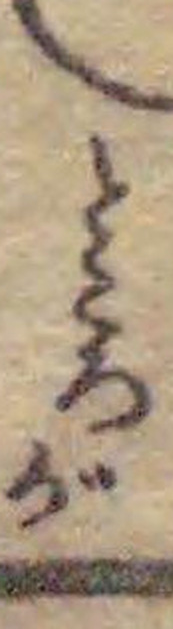ところが
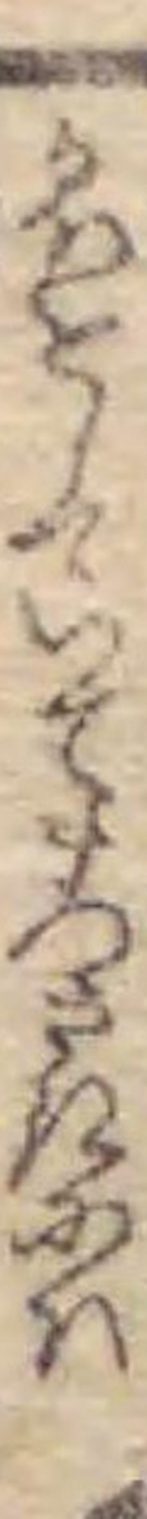かほをしていてまつさきには
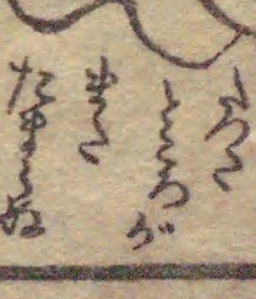たつた
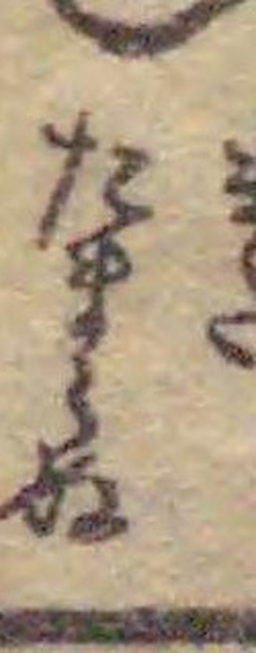たまらぬ
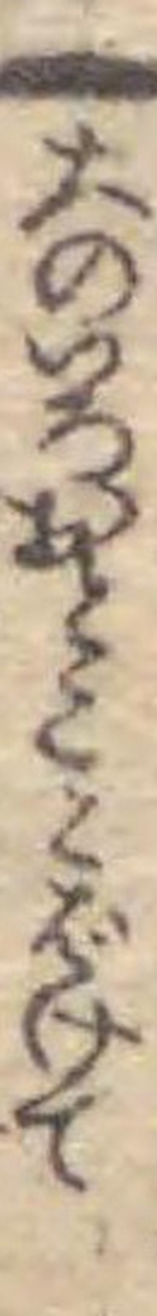大のいろおとことばけて
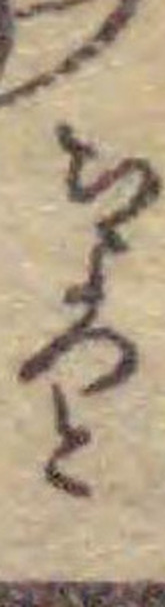ちよつと
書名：扨化狐通人 : 2巻
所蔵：国立国会図書館 National Diet Library, JAPAN
